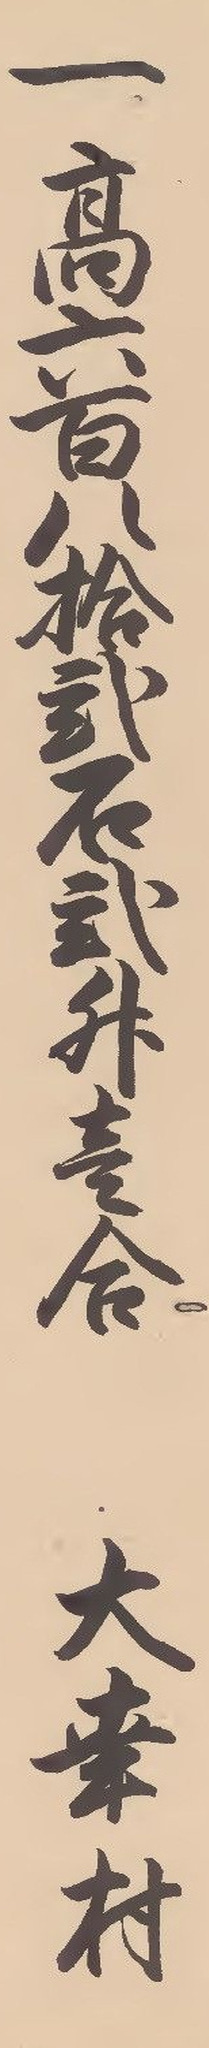一高六百八拾弐石弐升壱合大幸村
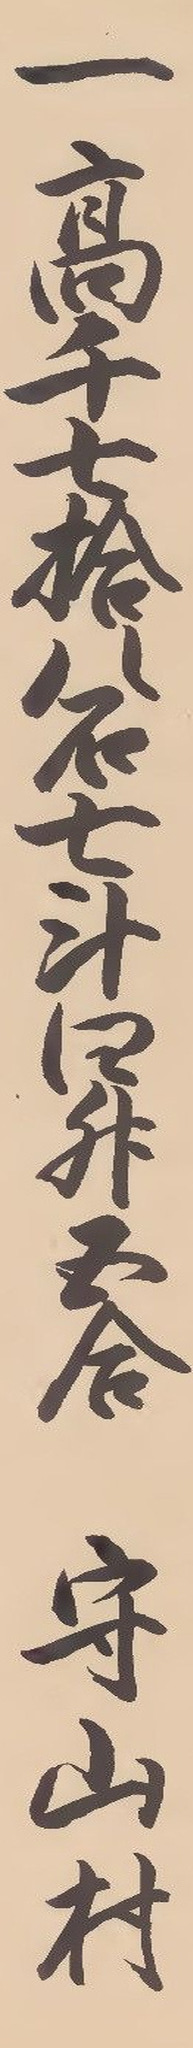一高千七拾八石七斗四升五合守山村
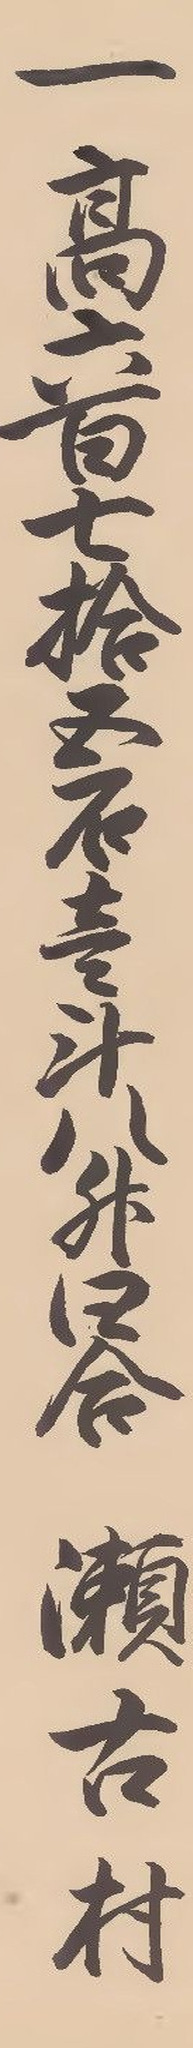一高六百七拾五石壱斗八升四合瀬古村
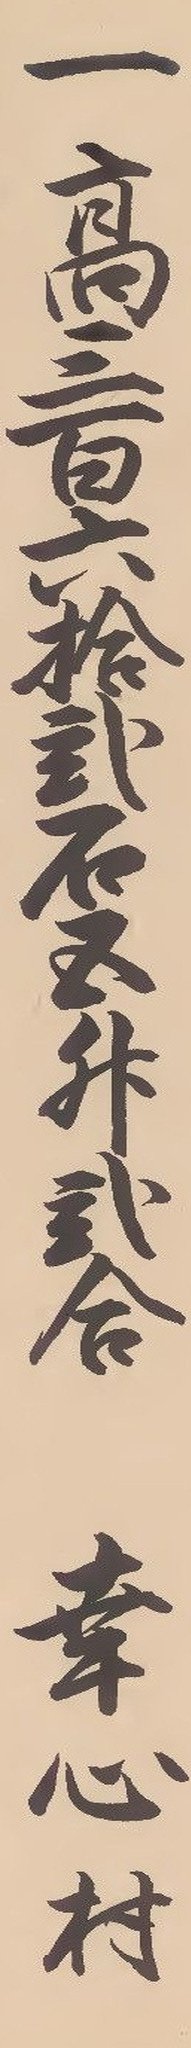一高三百六拾弐石五升弐合幸心村
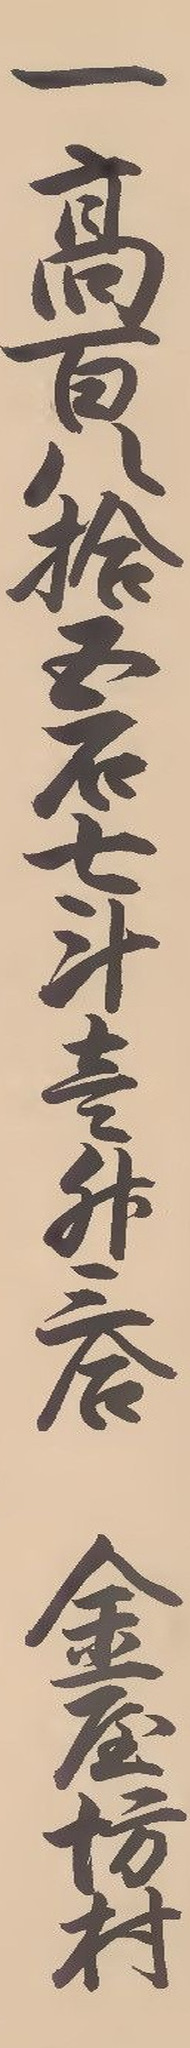一高百八拾五石七斗壱升三合金屋坊村
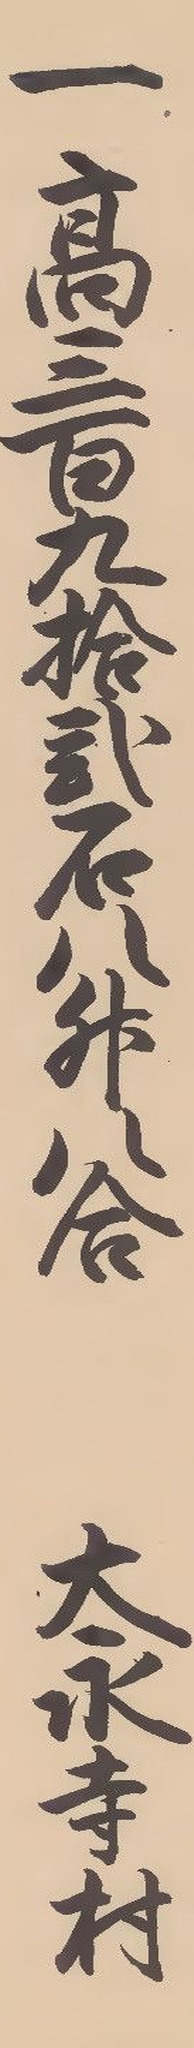一高三百九拾弐石八升八合大永寺村
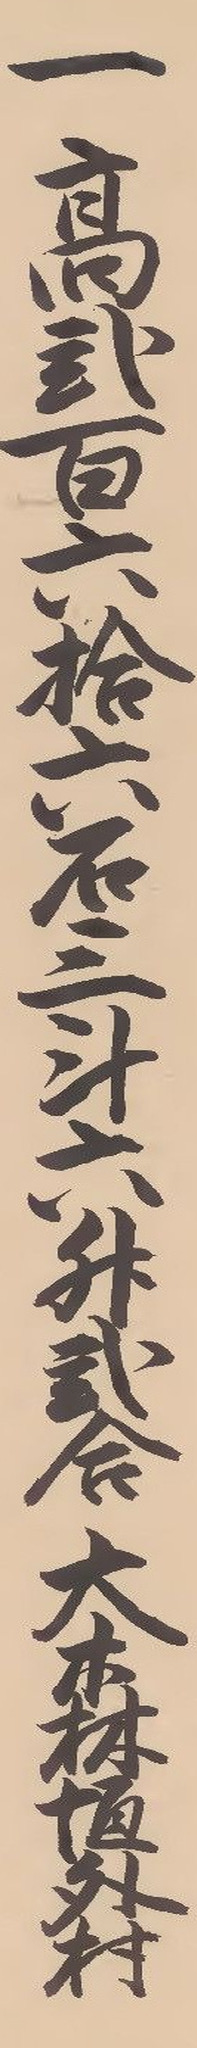一高弐百六拾六石三斗六升弐合大森垣外村
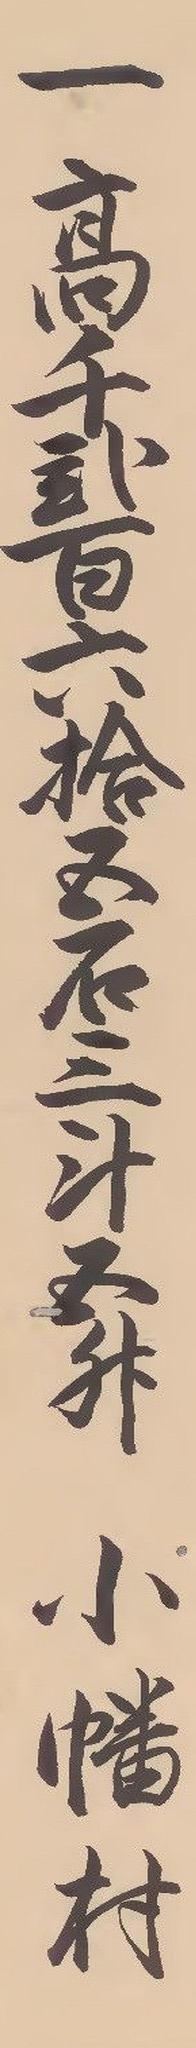一高千弐百六拾五石三斗五升小幡村

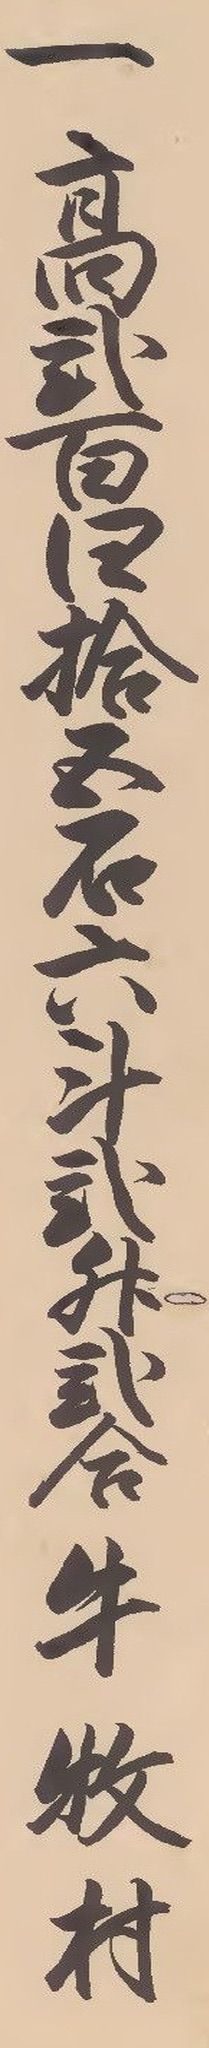一高弐百四拾五石六斗弐升弐合牛牧村
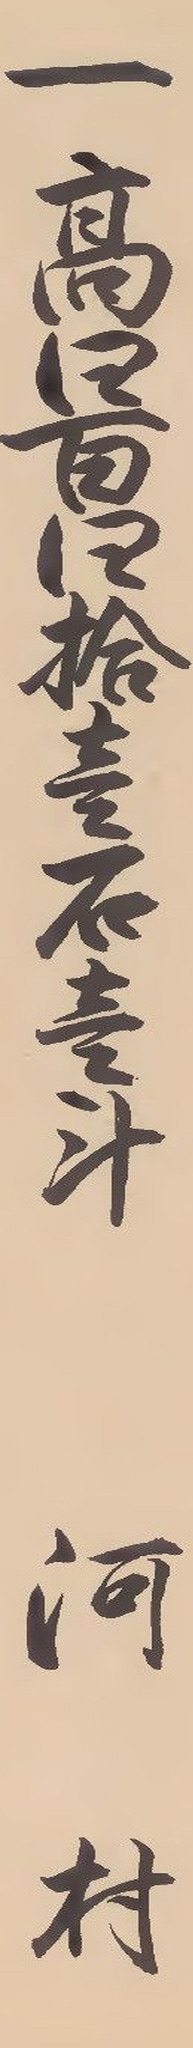一高四百四拾壱石壱斗河村
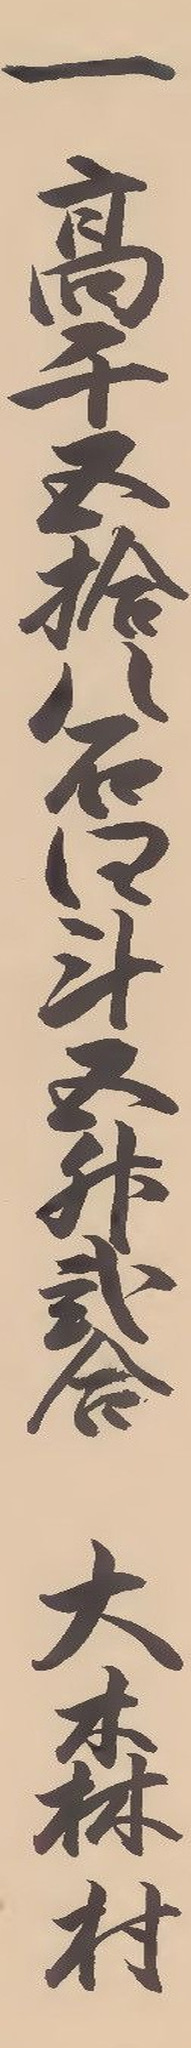一高千五拾八石四斗五升弐合大森村
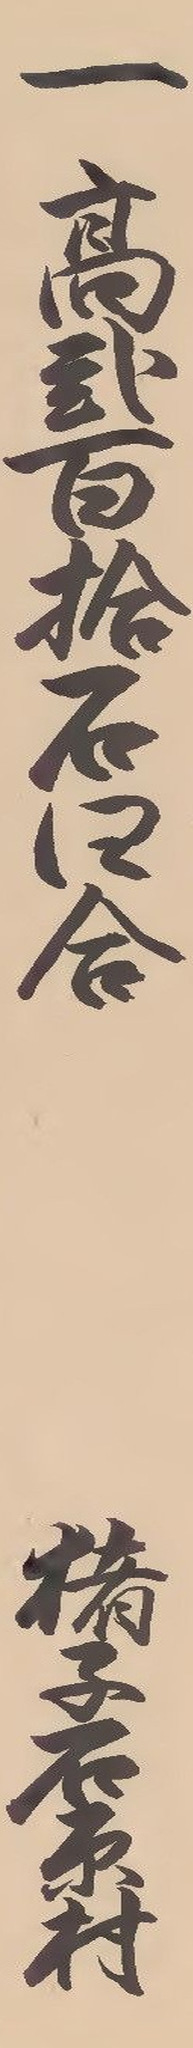一高弐百拾石四合猪子石原村
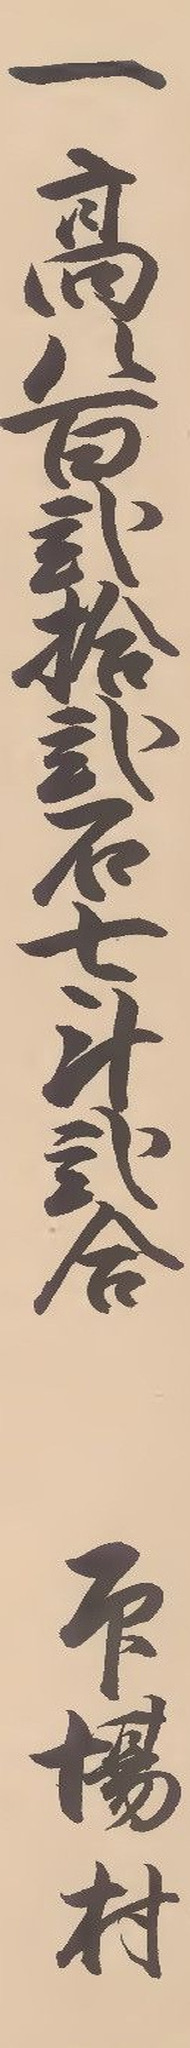一高八百弐拾弐石七斗弐合印場村
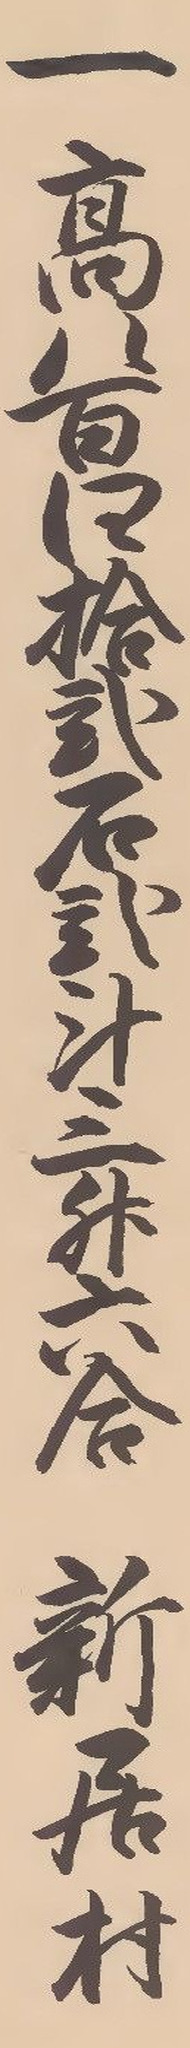一高八百四拾弐石弐斗三升六合新居村
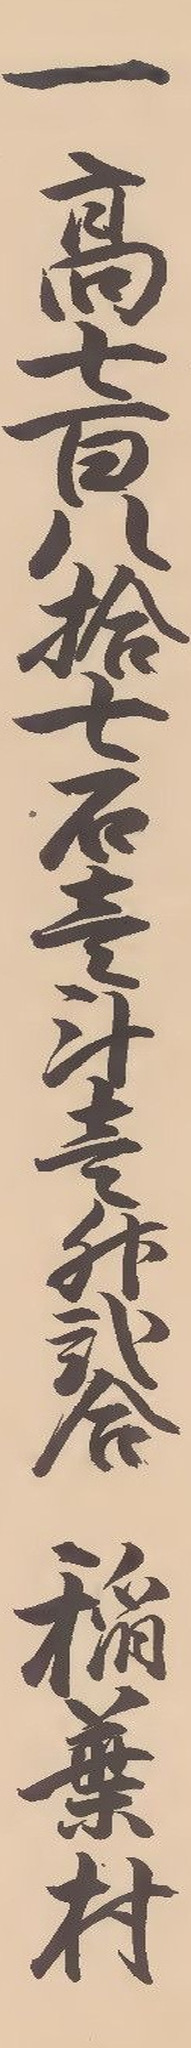一高七百八拾七石壱斗壱升弐合稲葉村
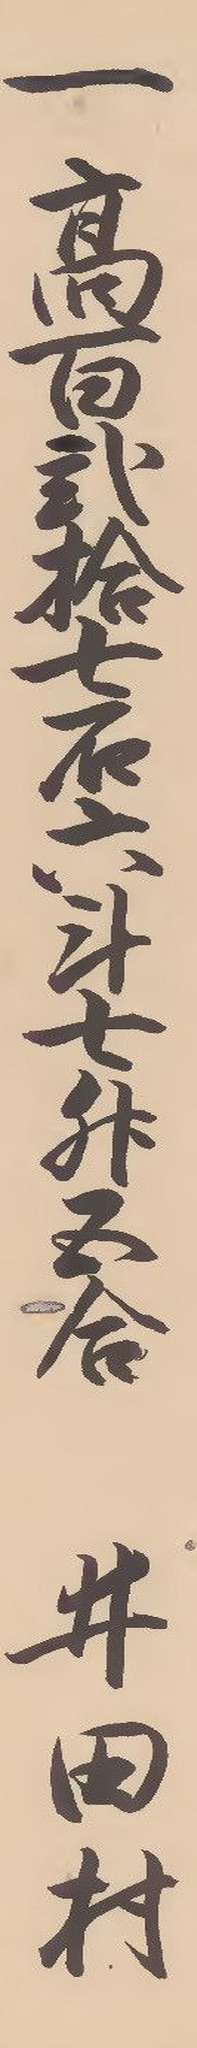一高百弐拾七石六斗七升五合井田村
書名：尾張国郷帳
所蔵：国立公文書館 National Archives of Japan
